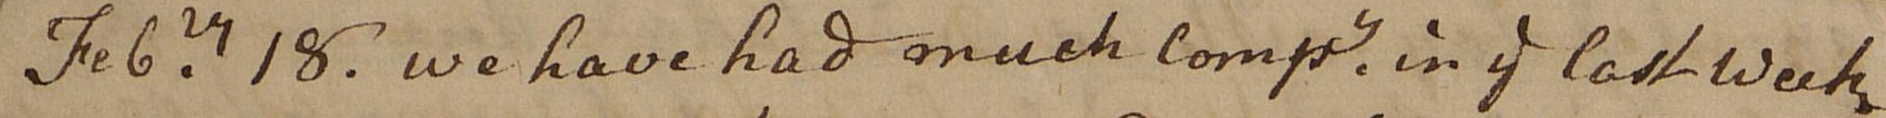Feb^ry. 18. we have had much Comp^y. in y^e last week
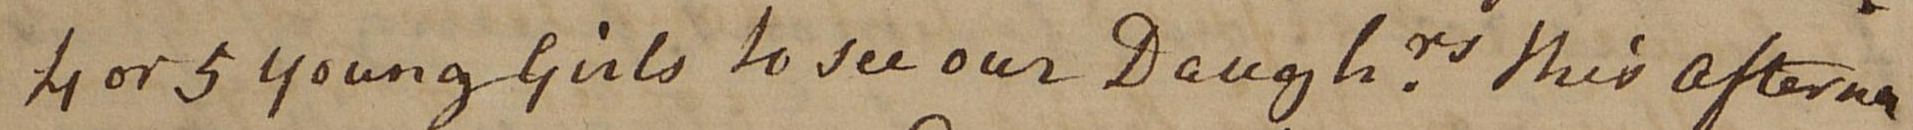4 or 5 young Girls to see our Daugh^rs. this afternoon
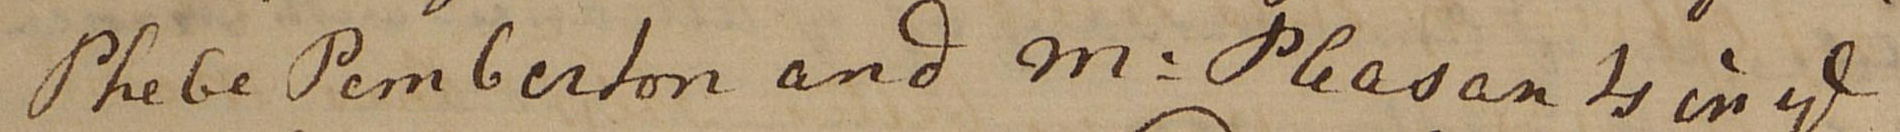Phebe Pemberton and M: Pleasants in y^e
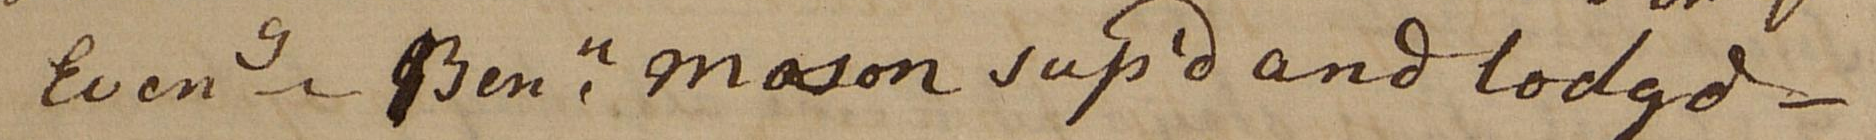Even^g- Ben^n. Mason sup'd and lodgd-
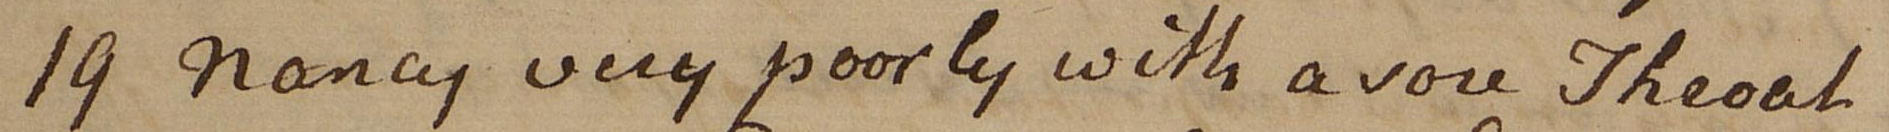19 Nancy very poorly with a sore Throat
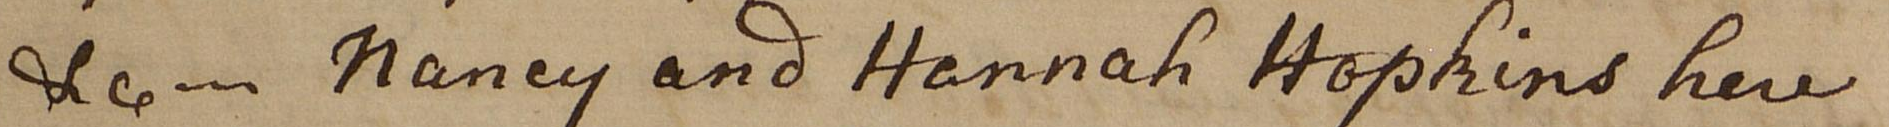&c- Nancy and Hannah Hopkins here
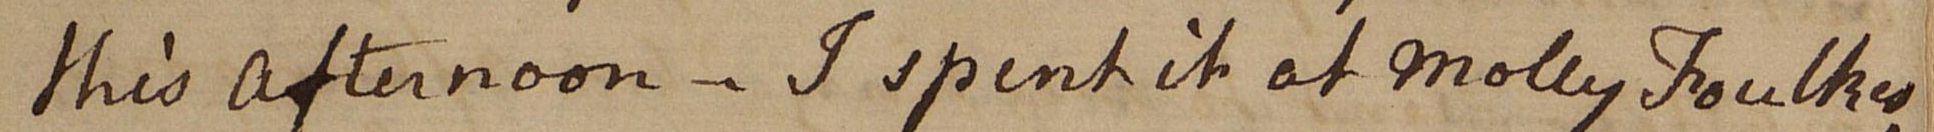this Afternoon- I spent it at Molly Foulkes,
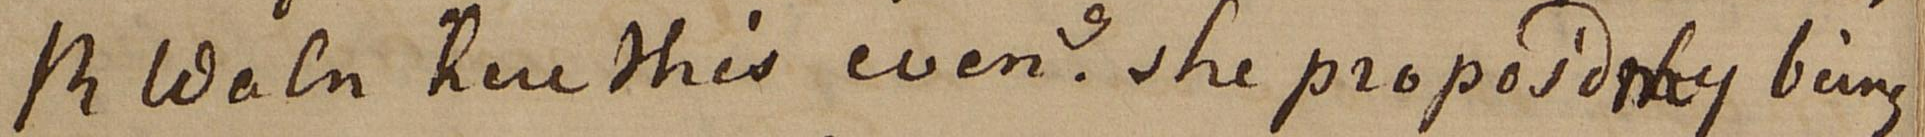R Waln here this even^g. she propos'd by being
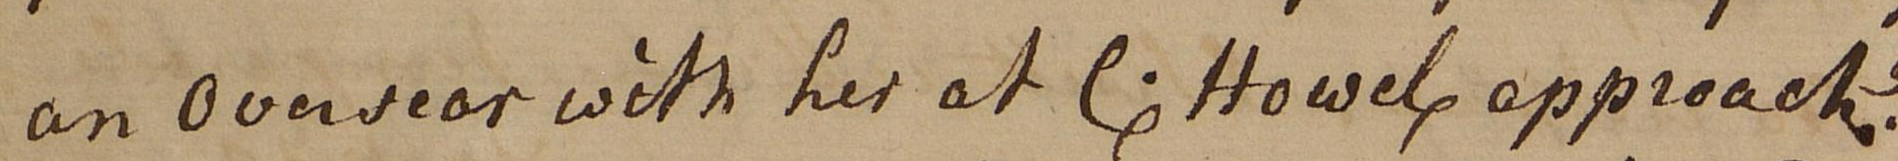an oversear with her at C. Howel approach^g.
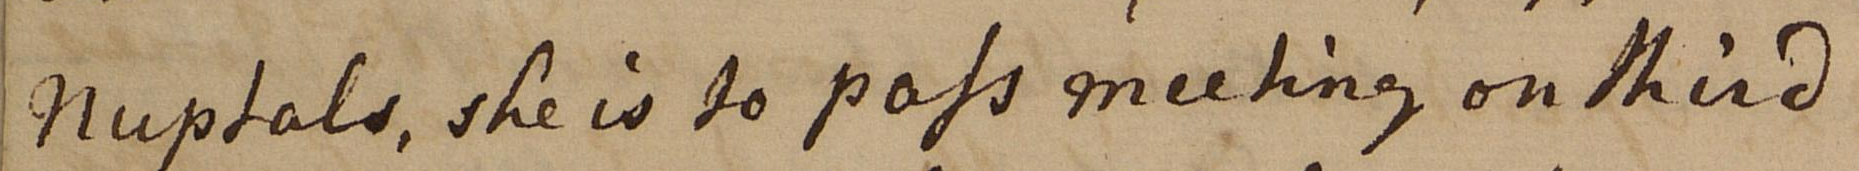nuptals, she is to pass meeting on third
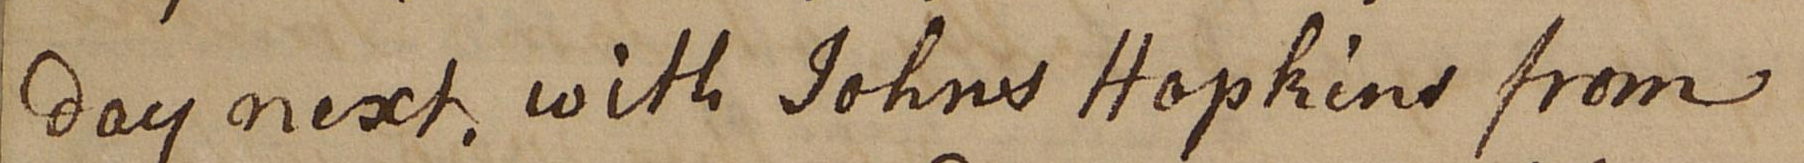day next, with Johns Hopkins from
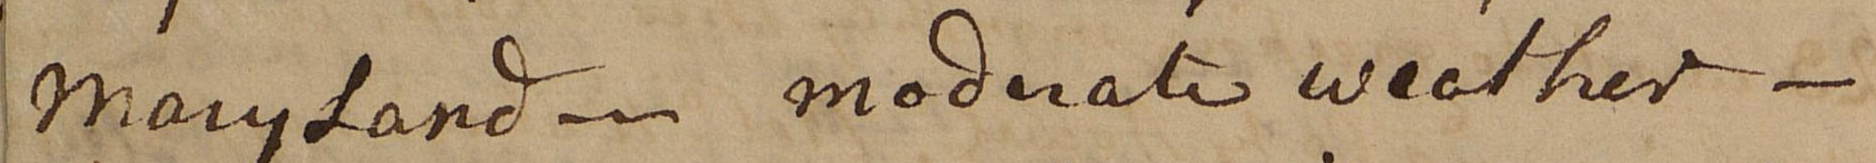Mary Land- moderate weather-
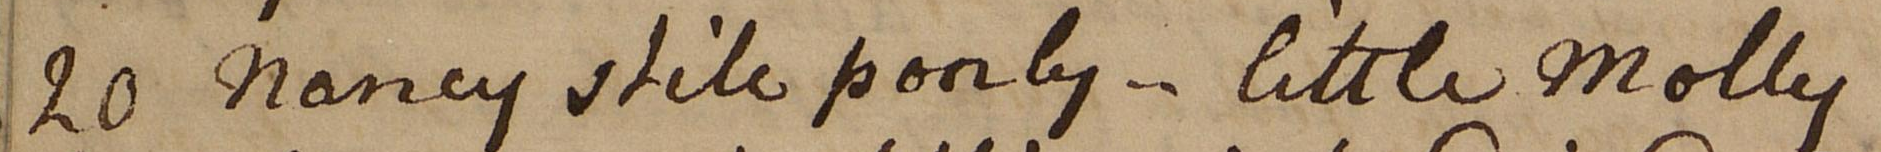20 Nancy still poorly- little Molly
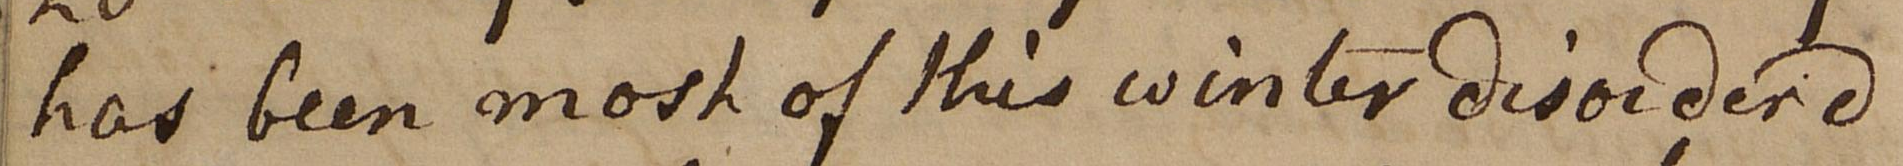has been most of this winter disorderd
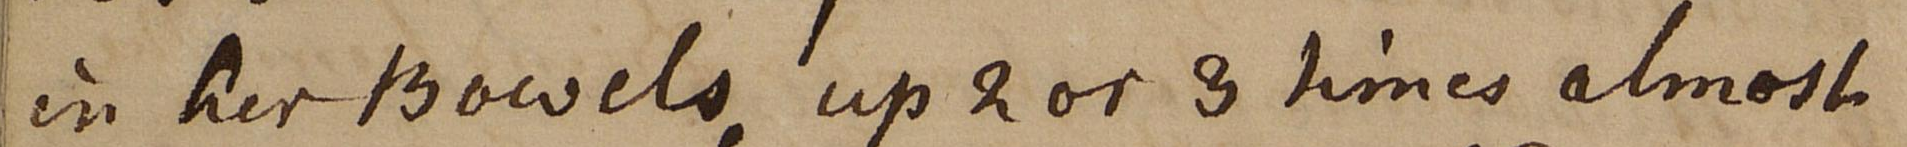in her Bowels, up 2or 3 times almost
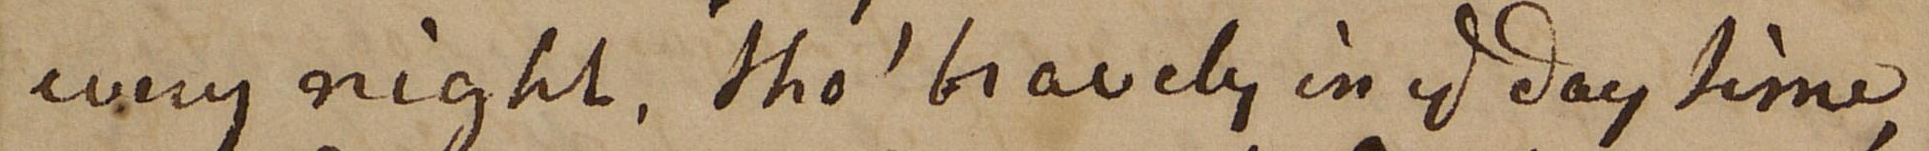every night, tho' bravely in y^e day time,
